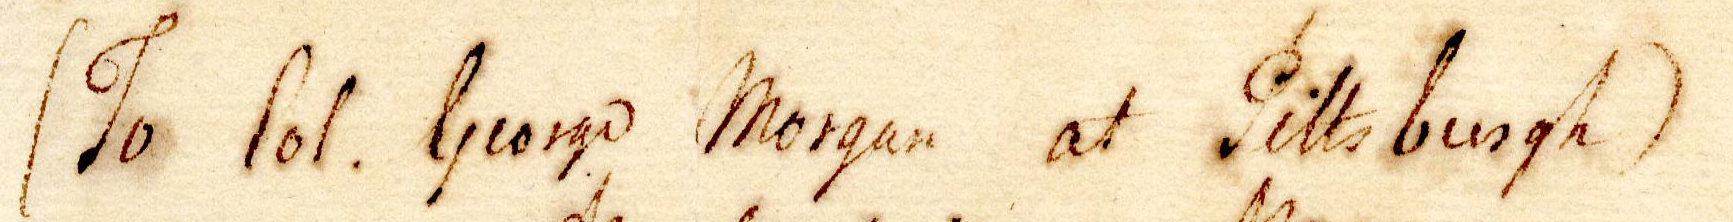To Col. Geoge Morgan at Pittsburgh
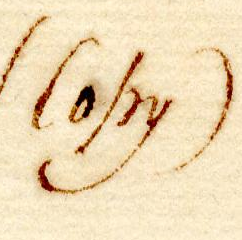(Copy)
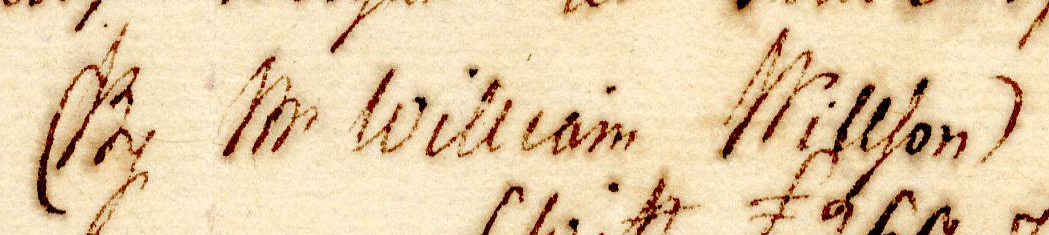(By M^r William Willson)
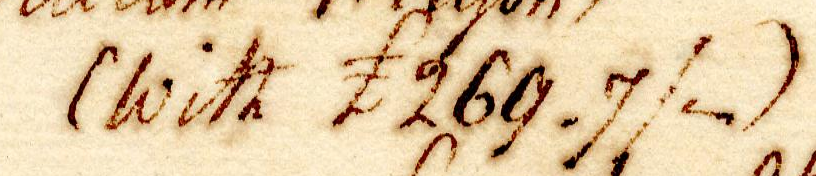(With £269. 7/)
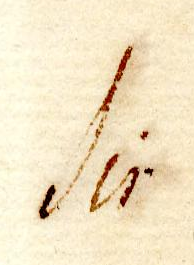Sir
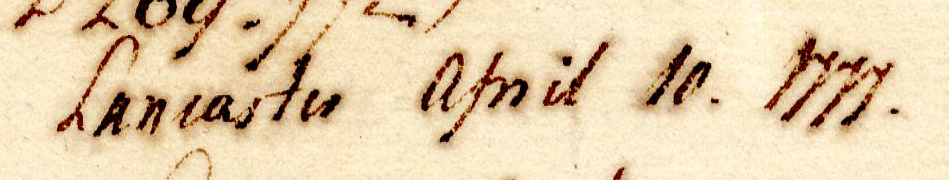Lancaster April 10. 1777.
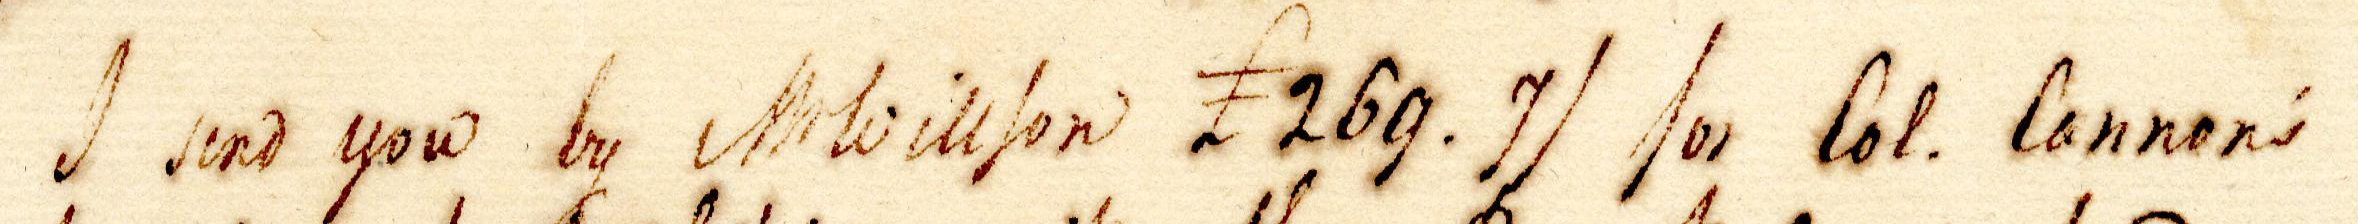I send you by M^r Willson £269. 7/ for Col. Cannon's
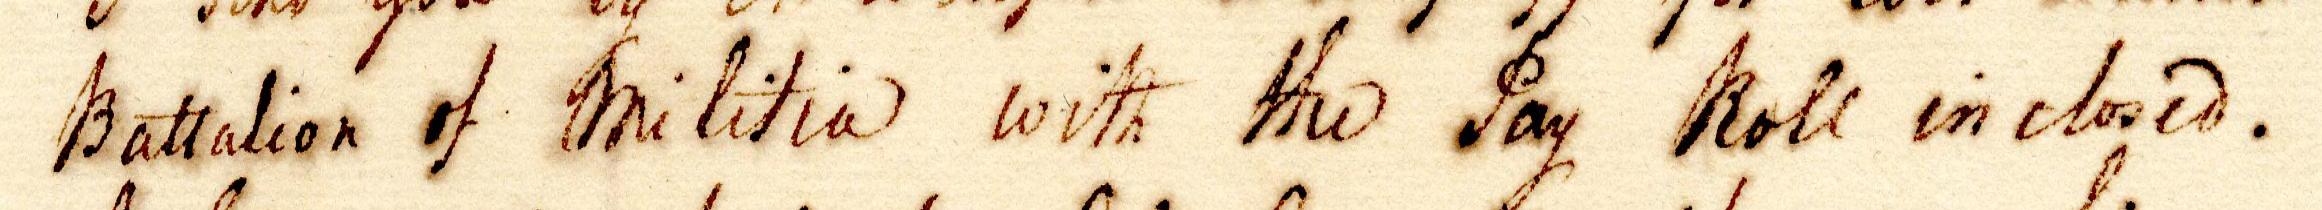Battalion of Militia with the Pay Roll inclosed.
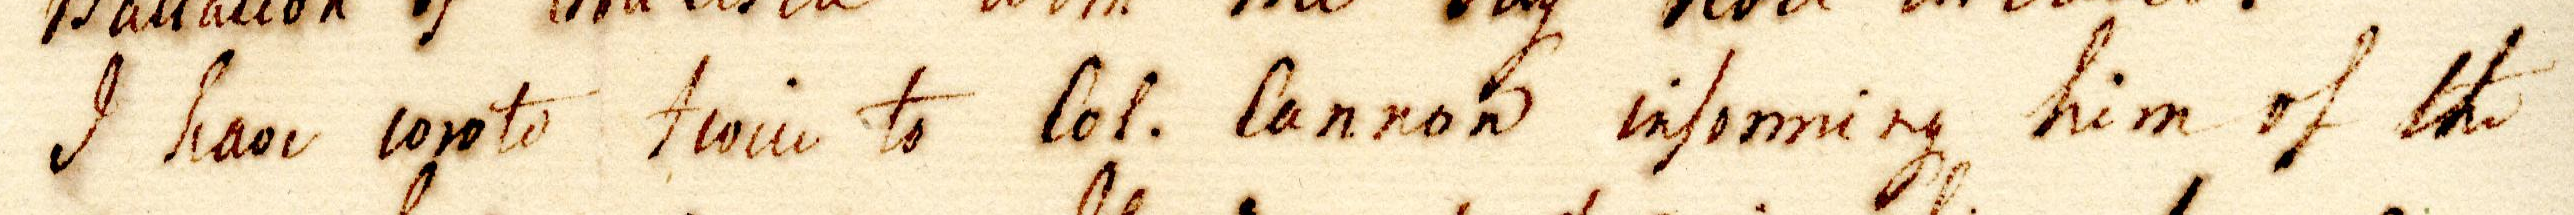I have wrote twice to Col. Cannon informing him of the
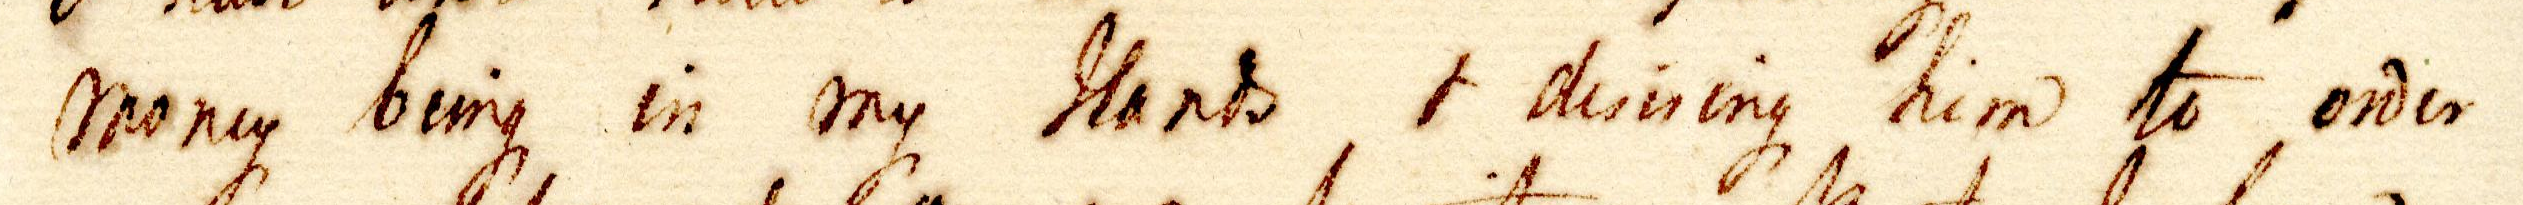money being in my Hands & desiring him to order
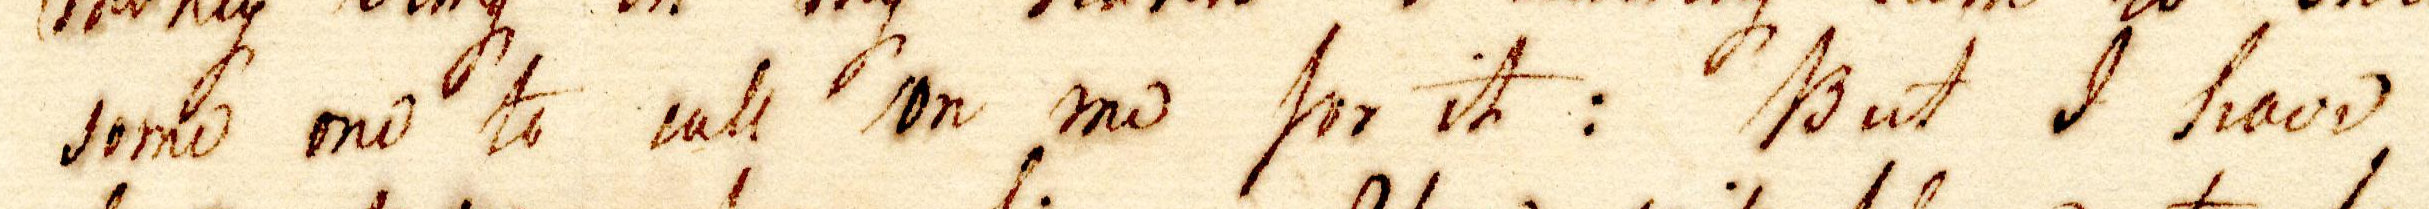some one to call on me for it: But I have
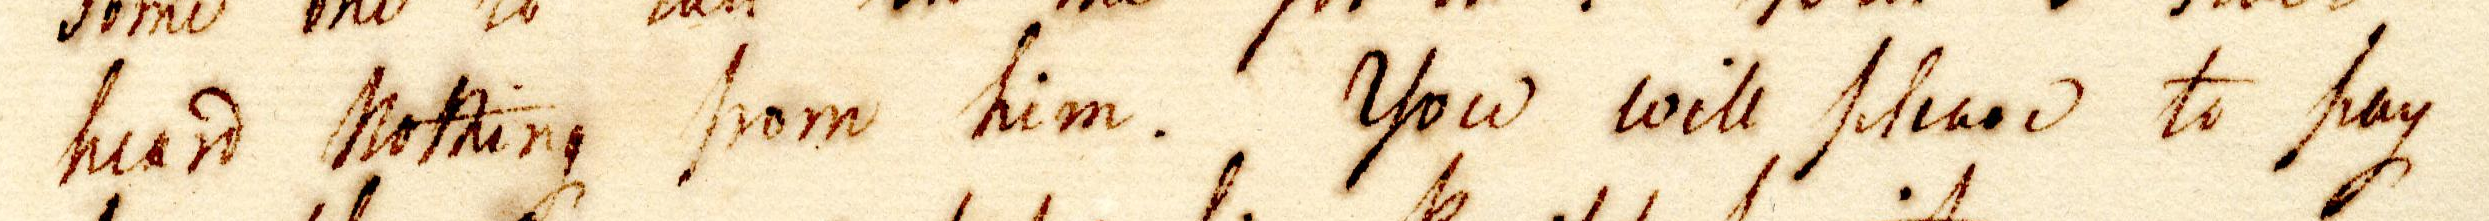heard Nothing from him. You will please to pay
